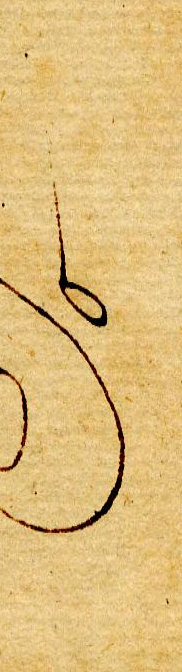To
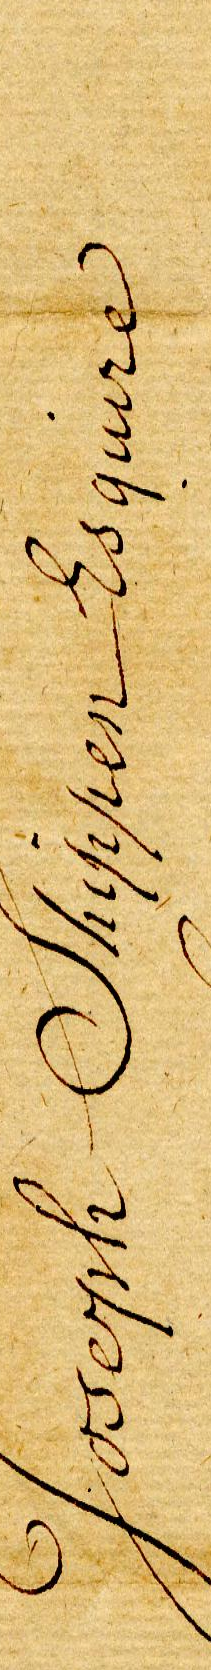Joseph Shippen Esquire
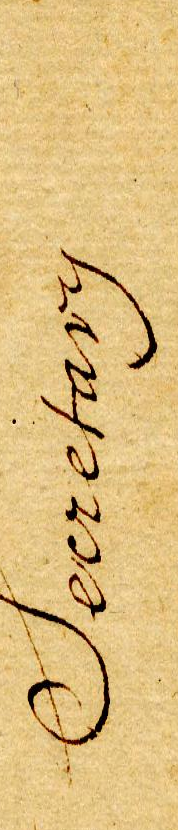Secretary
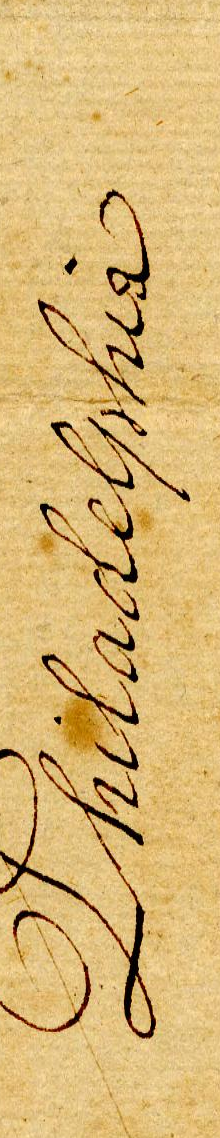Philadelphia
